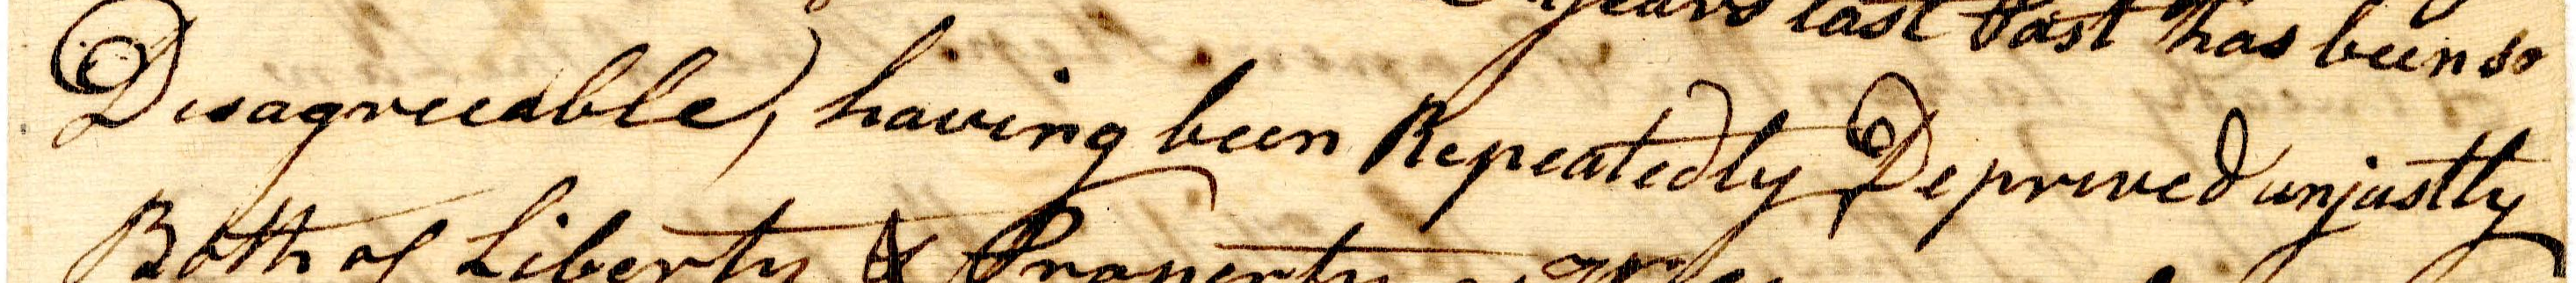Disagreeable, having been Repeatedly Deprived unjustly
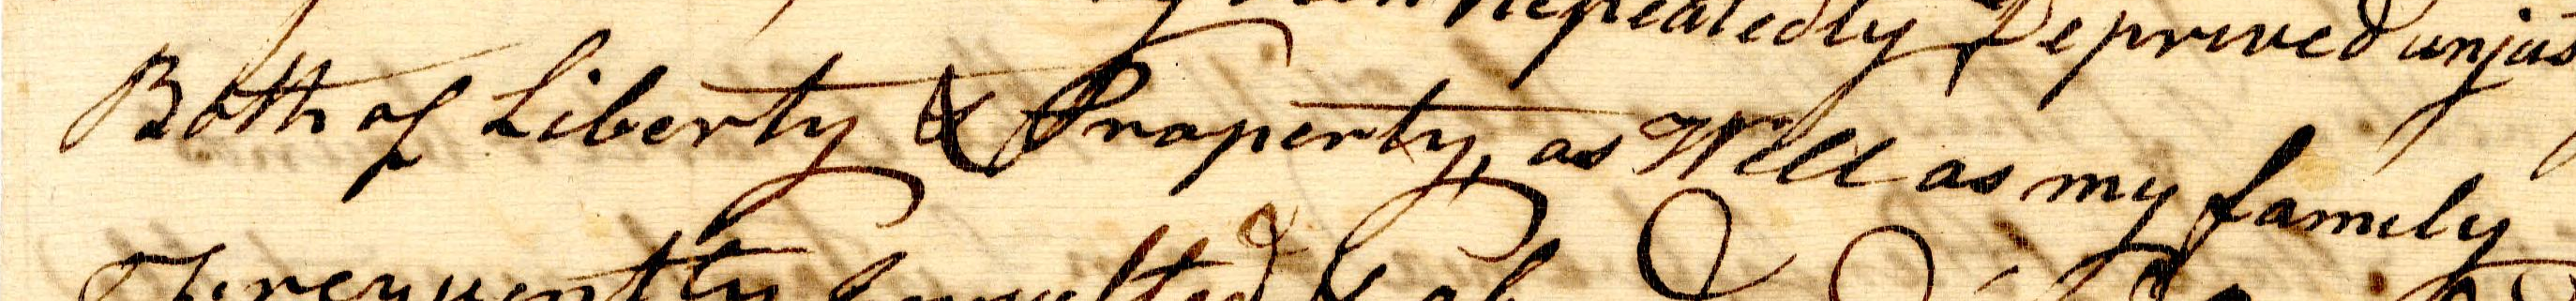Both of Liberty & Property, as Well as my family
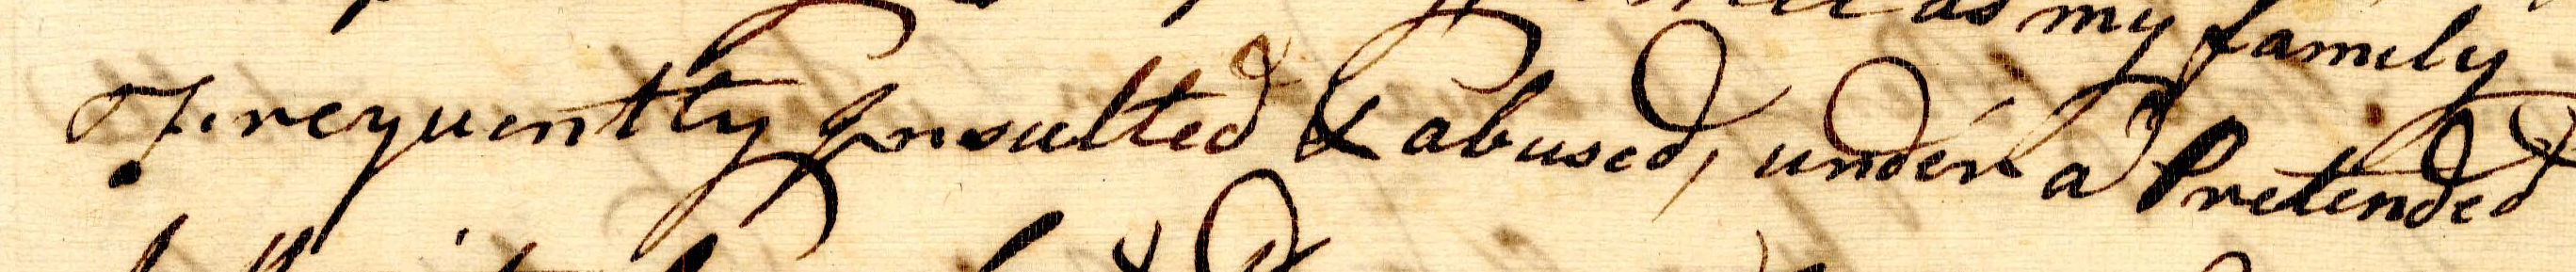frequently insulted & abused, under a Pretended
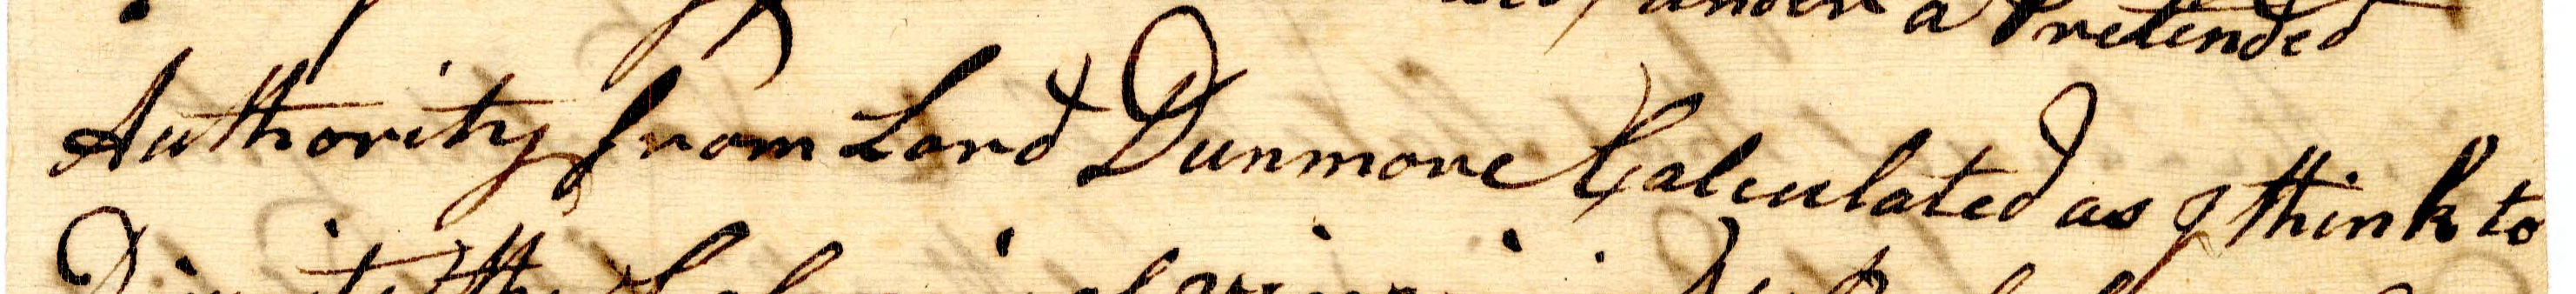Authority from Lord Dunmore Calculated as I think to
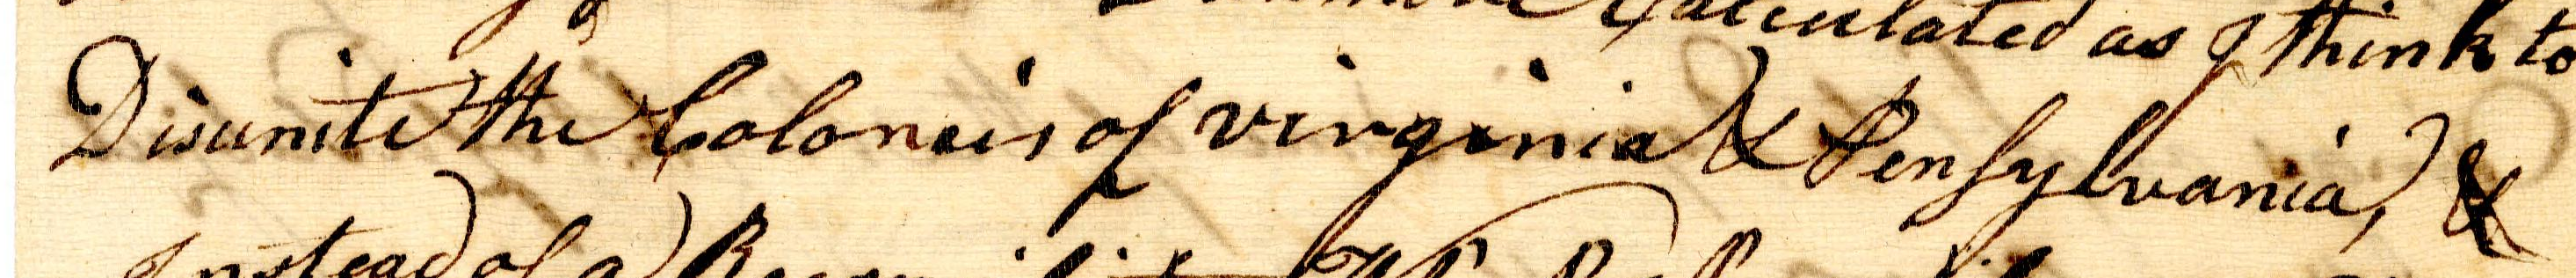Disunite the Colonies of Virginia & Pennsylvania, &
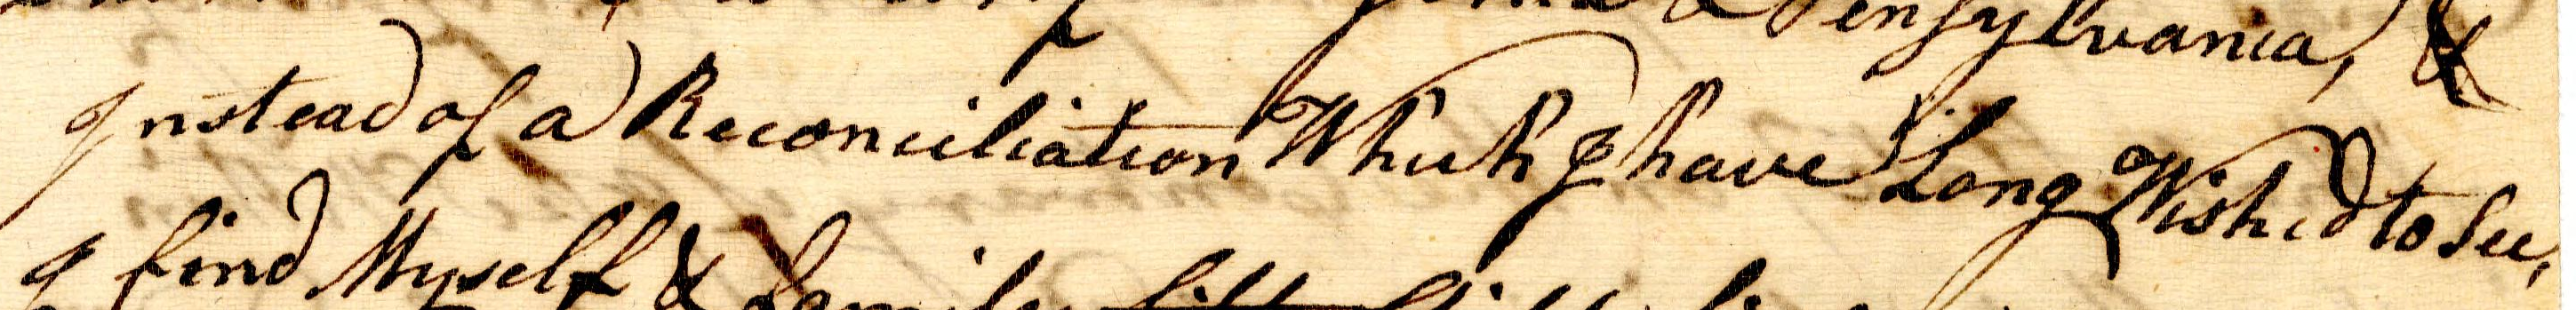Instead of a Reconciliation Which I have Long Wished to See,
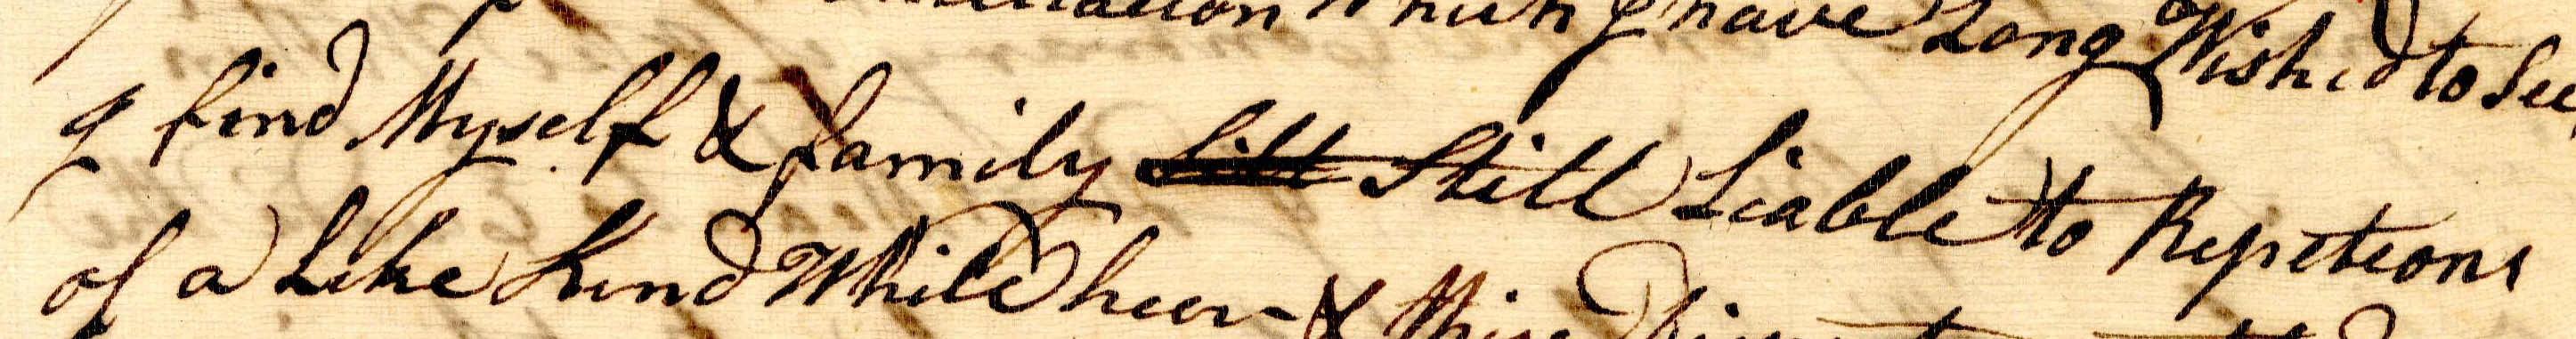I find Myself & family till Still Liable to Repetions
